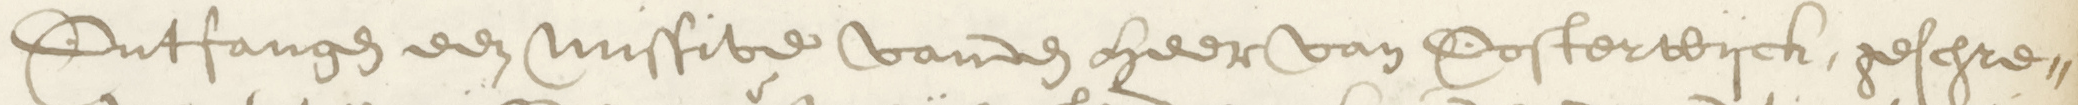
Ontfangen een missive vanden heer van Oosterwijck, geschre„
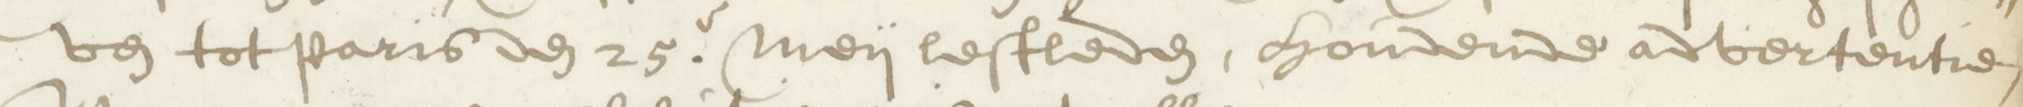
ven tot paris den 25e. meij lestleden, houdende advertentie,
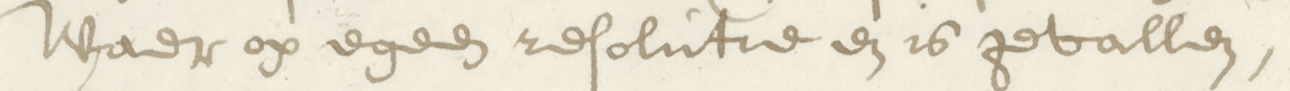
Waer op egeen resolutie en is gevallen.
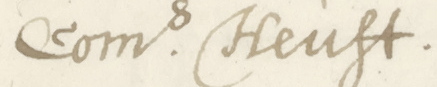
Coms. Heuft.
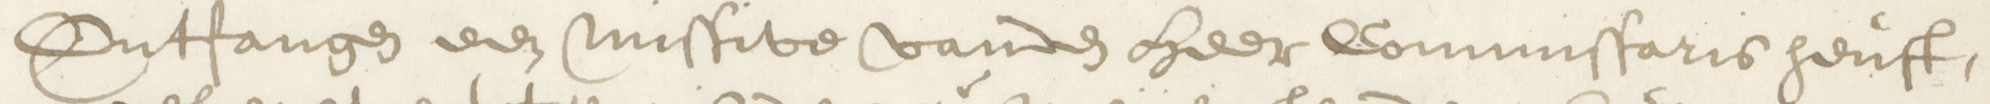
Ontfangen een missive vanden heer Commissaris heuft, —
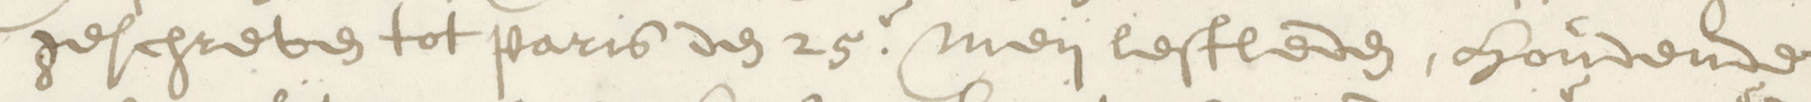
geschreven tot paris den 25e meij lestleden, houdende
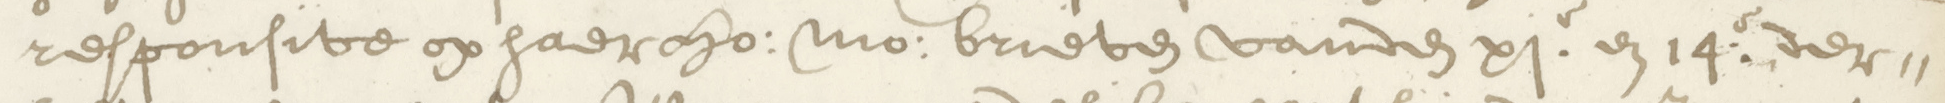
responsive op haer Ho:Mo: brieven vanden xie. en 14e. der„
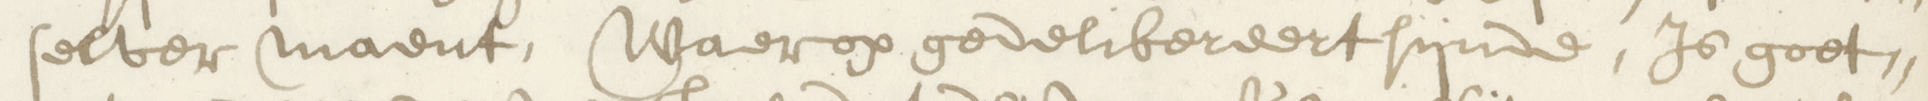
selver maent. Waerop gedelibereert sijnde, Is goet„
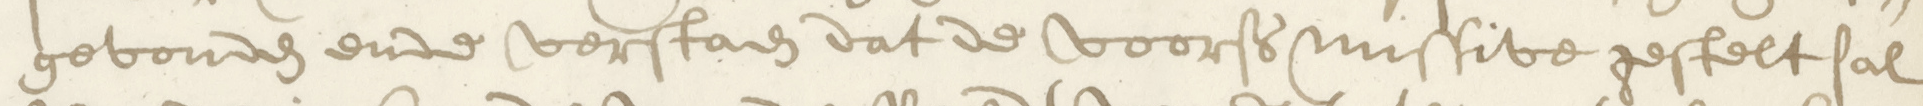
gevonden ende verstaen dat de voors missive gestelt sal
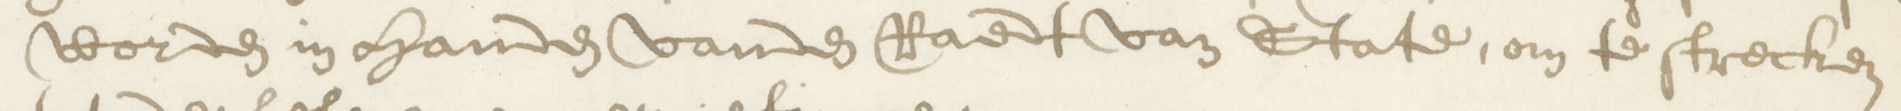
worden in handen vanden Raedt van State, om te strecken —
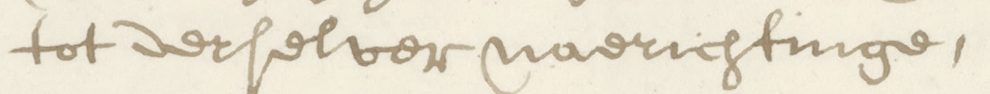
tot derselver naerichtinge.
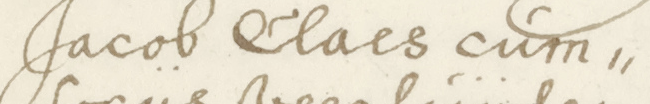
Jacob Claes cum,,
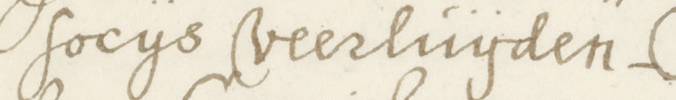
socijs Veerluijden
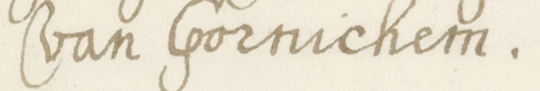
van Gornichem.
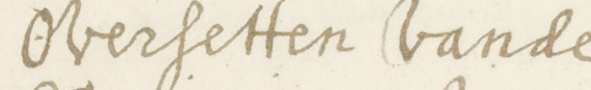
Oversetten vande
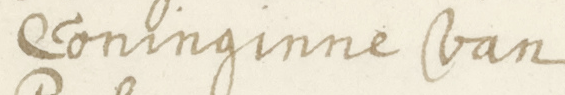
Coninginne van
